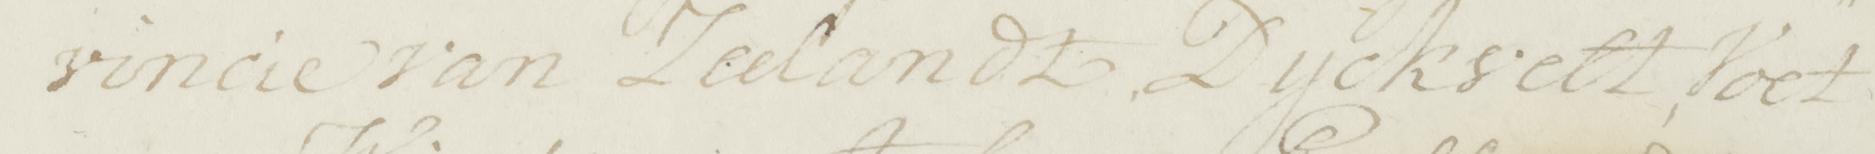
vincie van Zeelandt, Dyckvelt, Voet
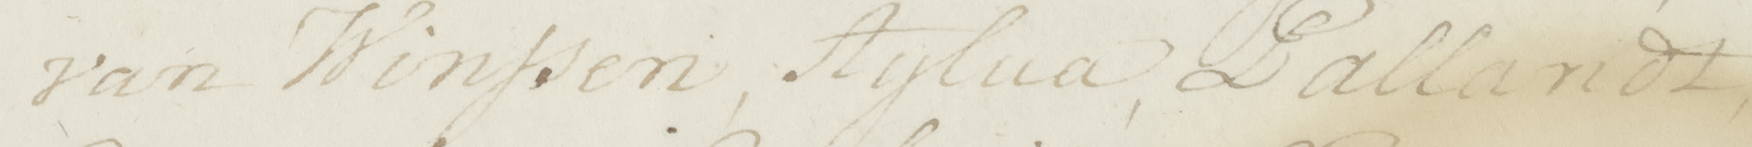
van Winssen, Aylua, Pallandt,
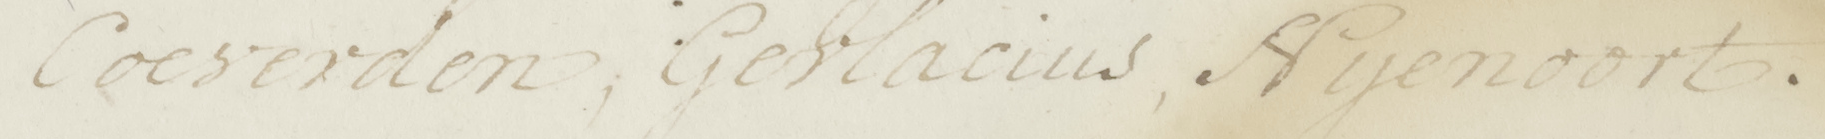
Coeverden, Gerlacius, Nyenoort.
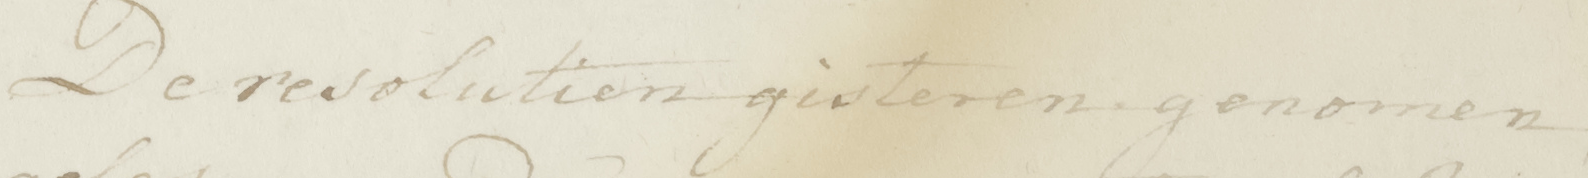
De resolutien gisteren genomen,
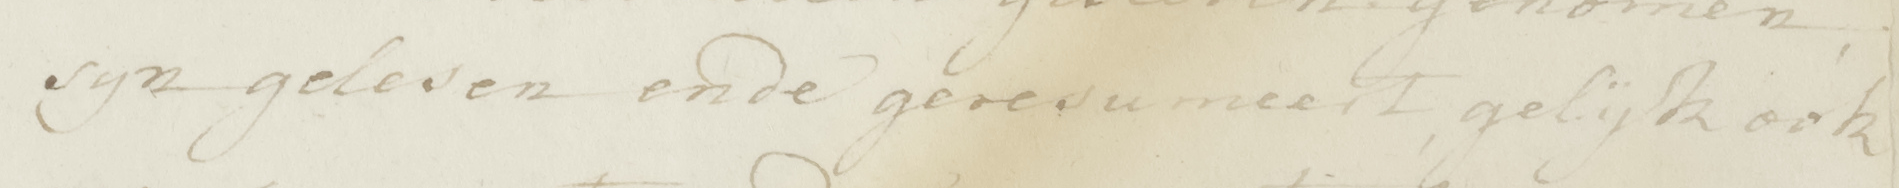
zijn gelesen ende geresumeert gelijk ook
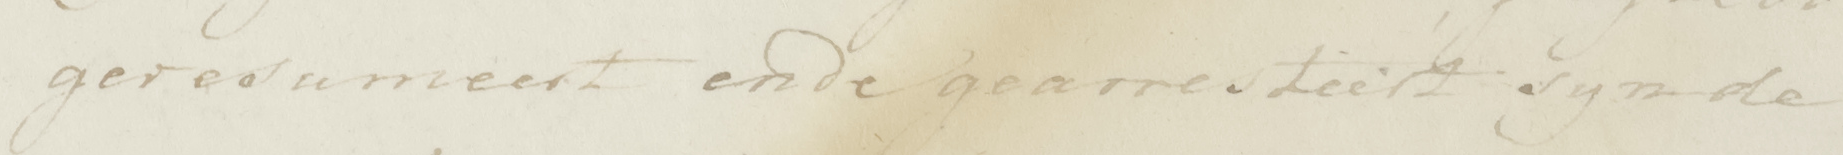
geresumeert ende gearresteert syn de
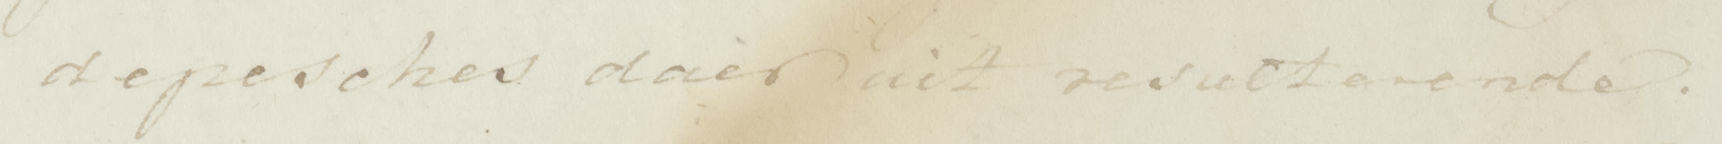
depesches daer uit resulterende.
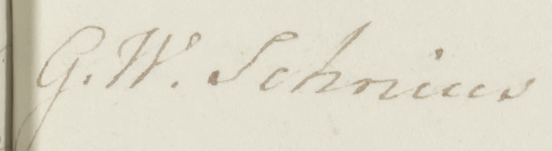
G.W. Schnius
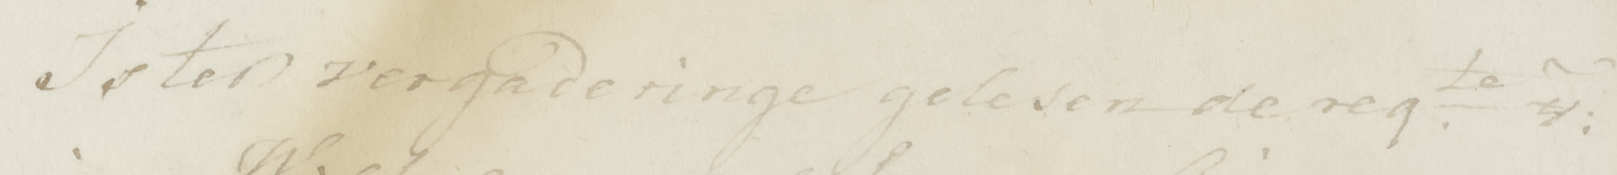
Is ter vergaderinge gelesen de reqte. #:
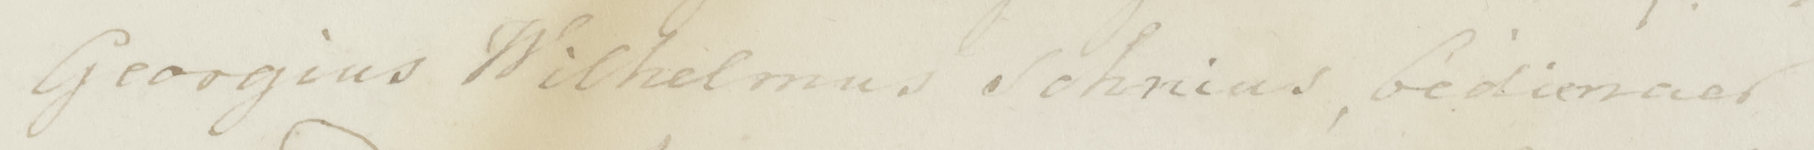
Georgius Wilhelmus Schnius, bedienaer
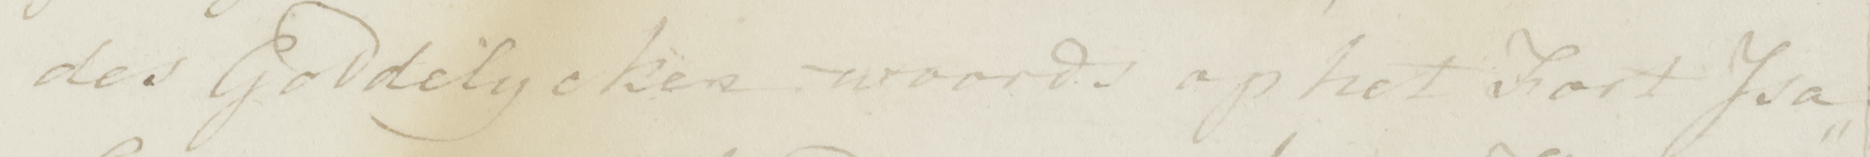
des Goddelycken woords op het Fort Isa„
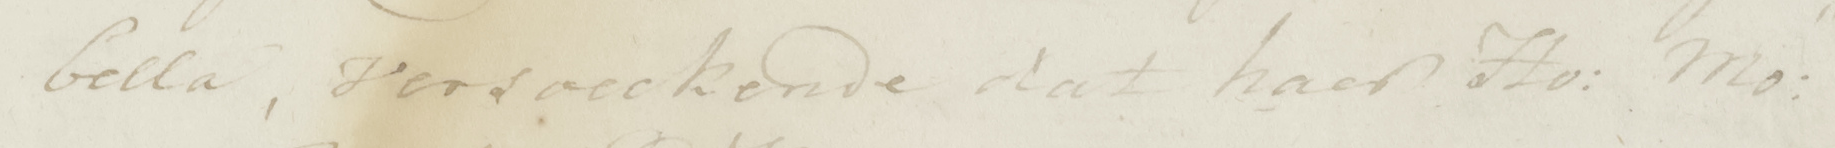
bella, versoeckende dat haer Ho: Mo:
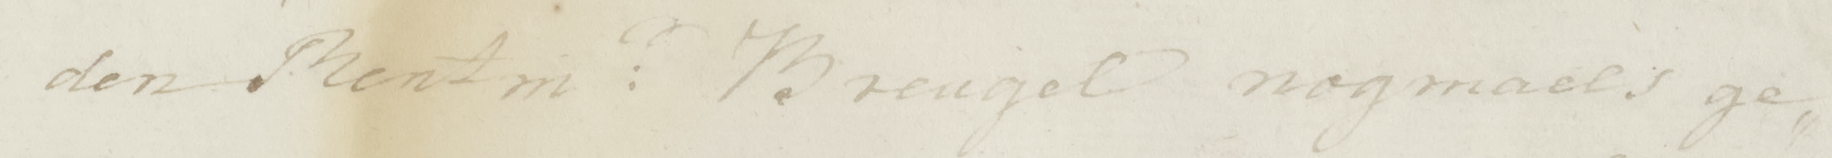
den Rentmr: Breugel nogmaels ge„
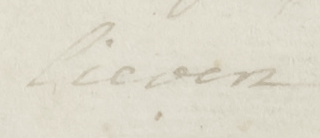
lieven
